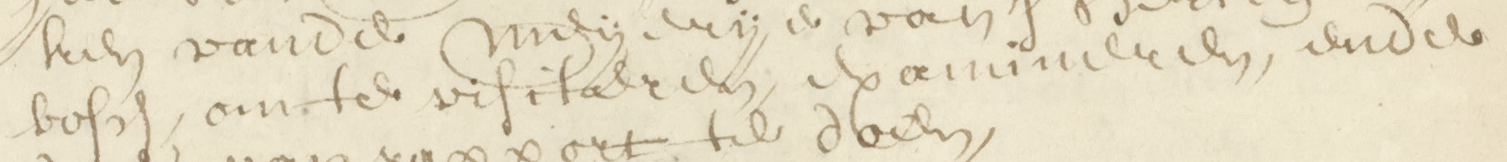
bosch, om te visiteren, examineren, ende
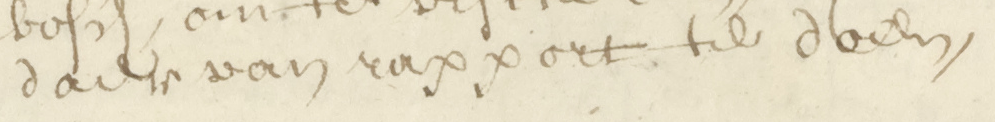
daer van rapport te doen.
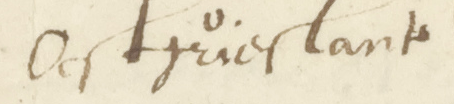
Oostfrieslant
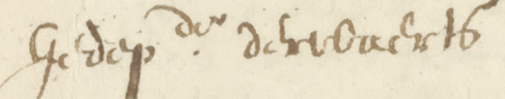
Gedepden derwaerts.
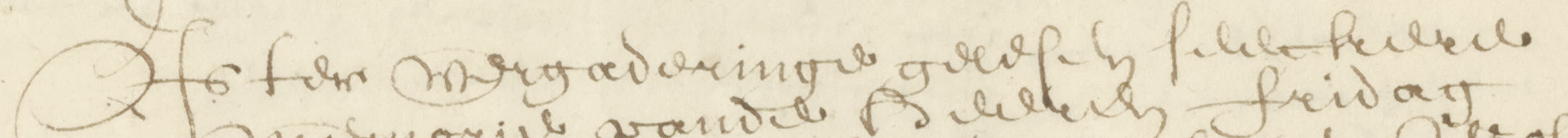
Is ter Vergaderinge gelesen seeckere
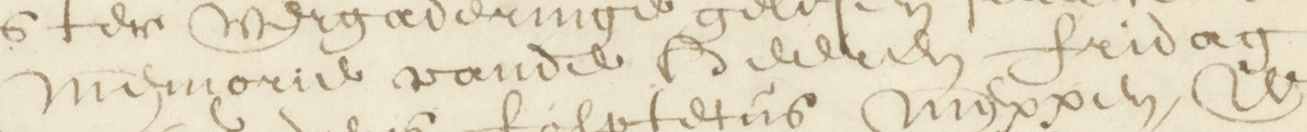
memorie vande Heeren Fridag
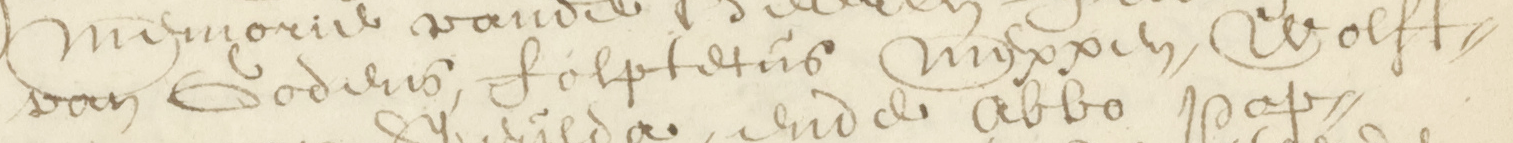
van Godens Folptetus Meppen, Wolff„
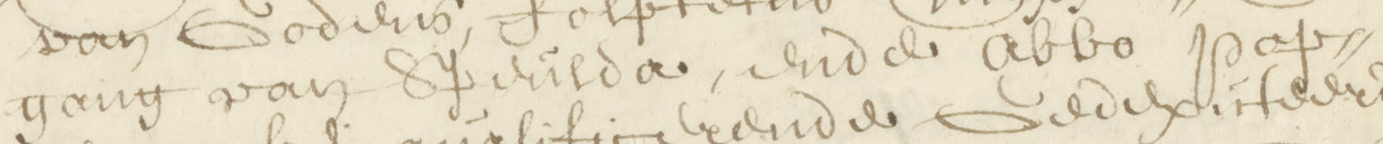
gang van Speulda, ende Abbo Pop,,
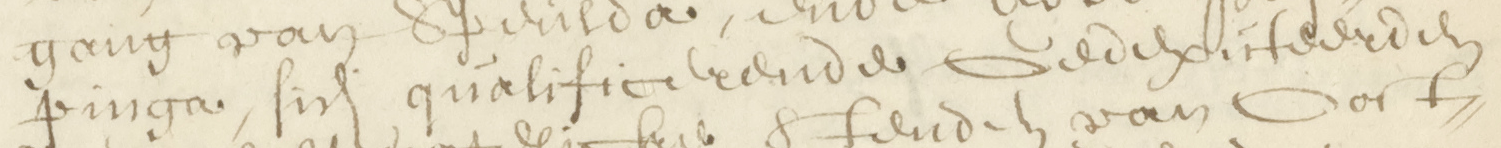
pinga, sich qualificerende Gedeputeerden
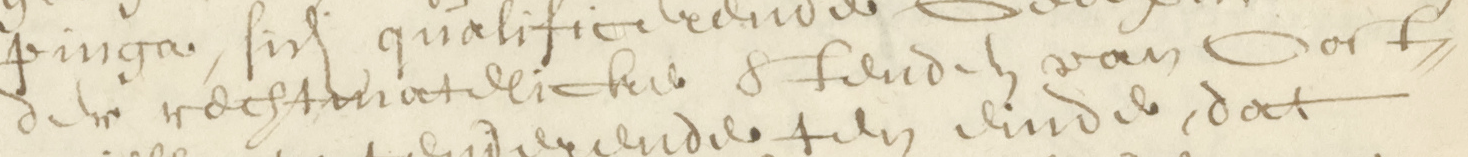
der rechtmatelicke Stenden van Oost,,
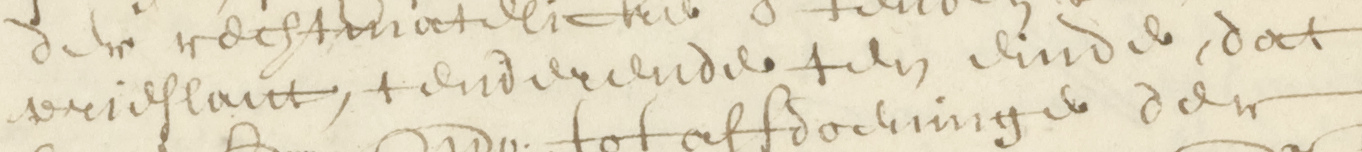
vrieslant, tenderende ten einde, dat
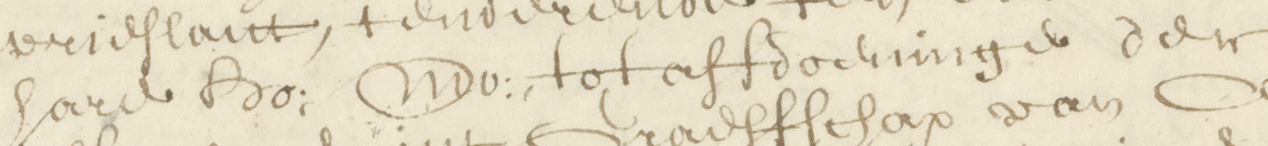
hare Ho:Mo: tot affdoeninge der
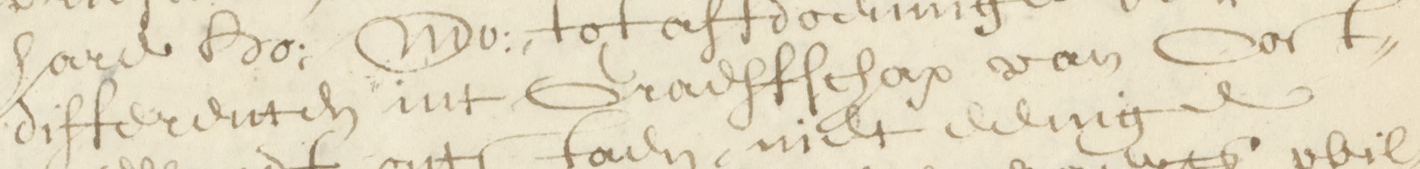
differenten int Graeffschap van Oost,,
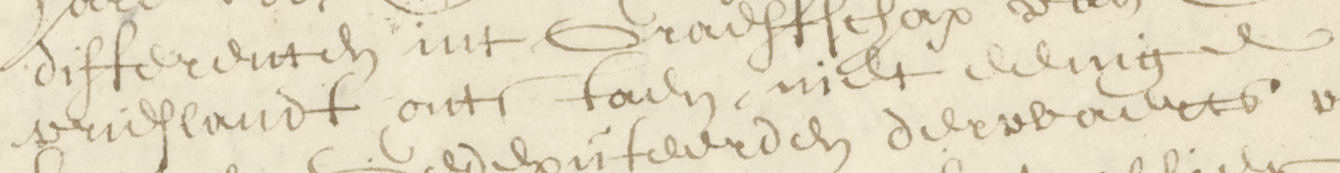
vrieslandt ontstaen, niet eenige
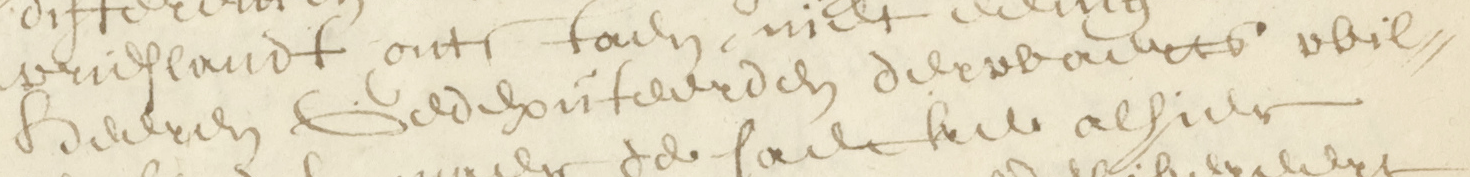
Heeren Gedeputeerden derwaerts wil„
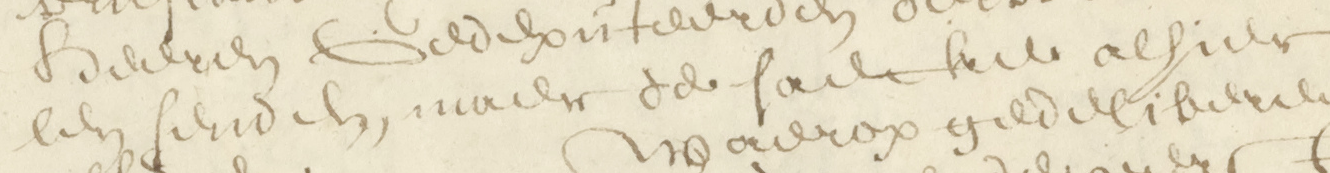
len senden, maer de saecke alhier
